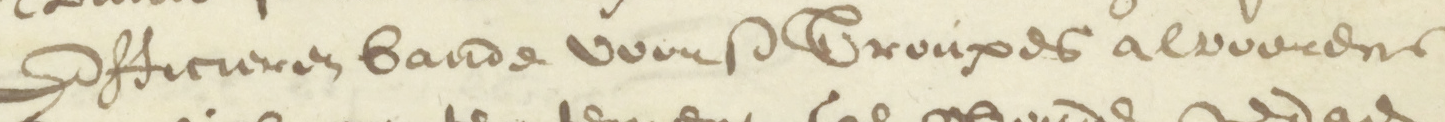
Officieren vande voors Troupes alvoorens
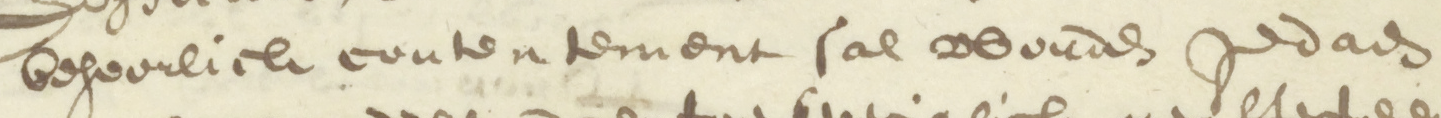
behoorlick contentement sal worden gedaen
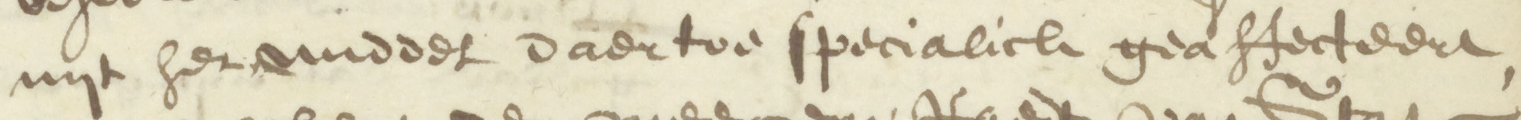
uyt het middel daertoe specialick geaffecteert
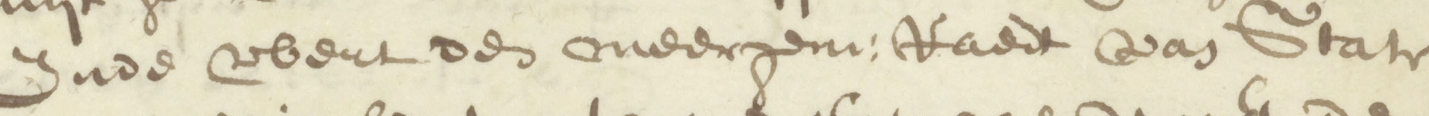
Ende wert den meergem: Raedt van State
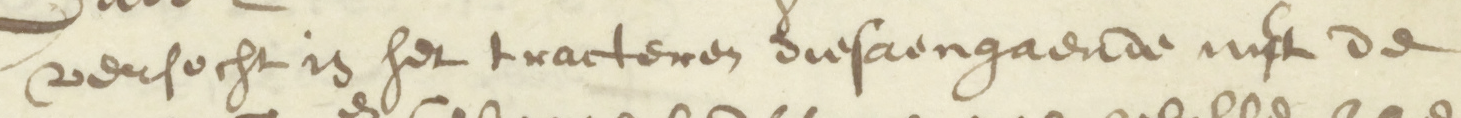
versocht in het tracteren diesaengaende uyt de
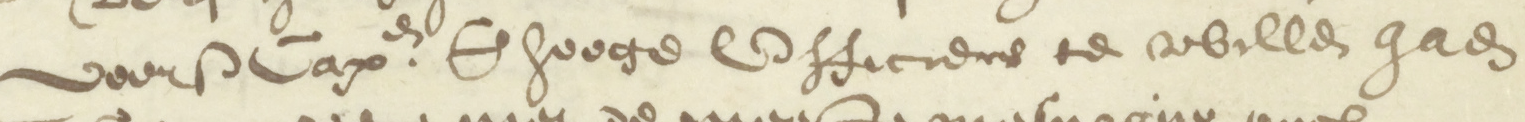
voors Capen. & hooge Officiere te willen gaen
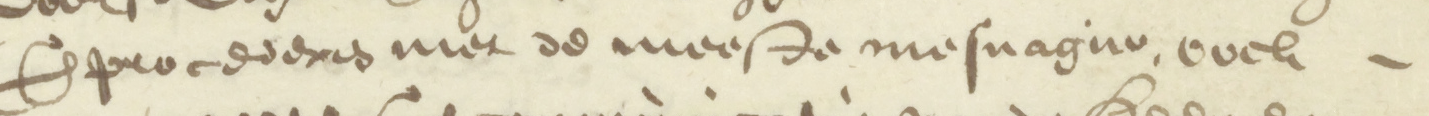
& procederen met de meeste mesnagie, oock -
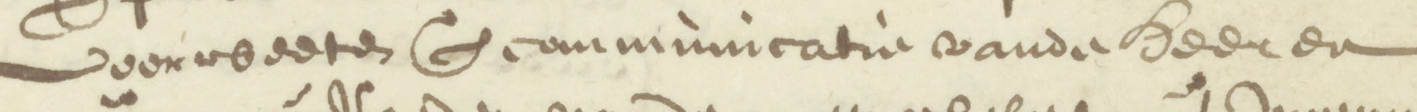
voorweeten & communicatie vande Heeren
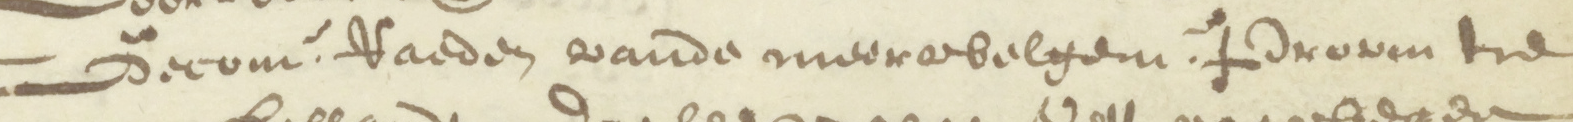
Gecome. Raeden vande meerwelgeme. Provintie
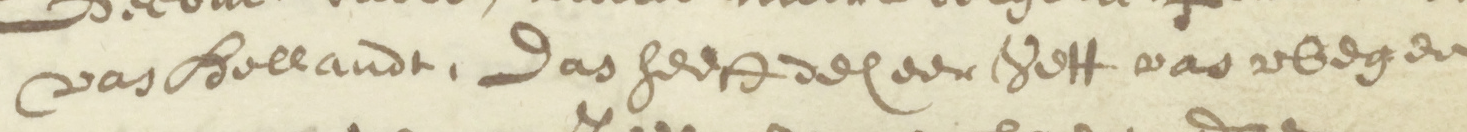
van Hollandt. Dan heeft de heer Vett van wegen
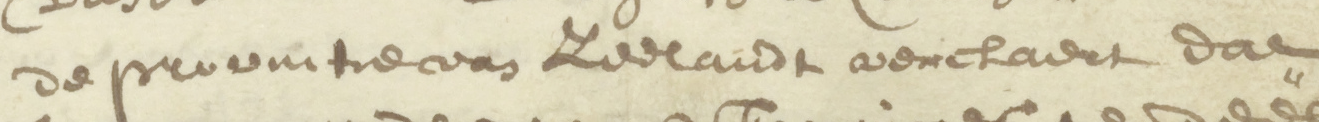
de provintie van Zeelandt verclaert dat„
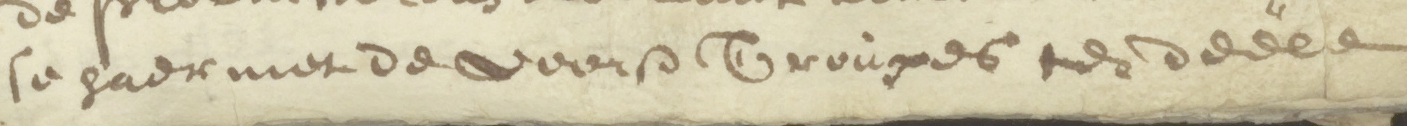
se haer met de voors Troupes ten deelen
